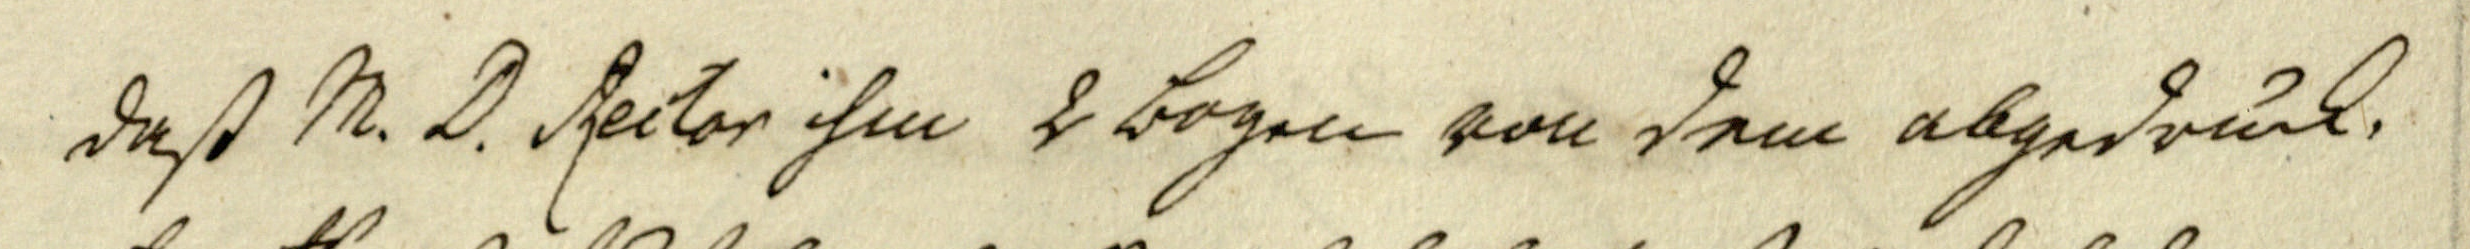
daß M. D. Rector ihm 2 Bogen von dem abgedruck¬
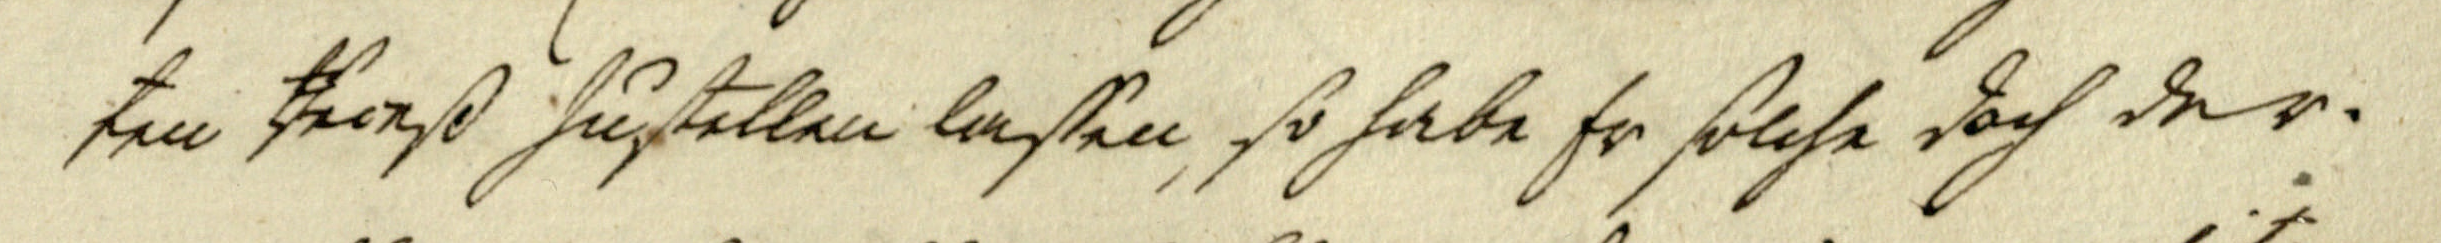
ten Receß zustellen lassen, so habe Er solche doch der¬
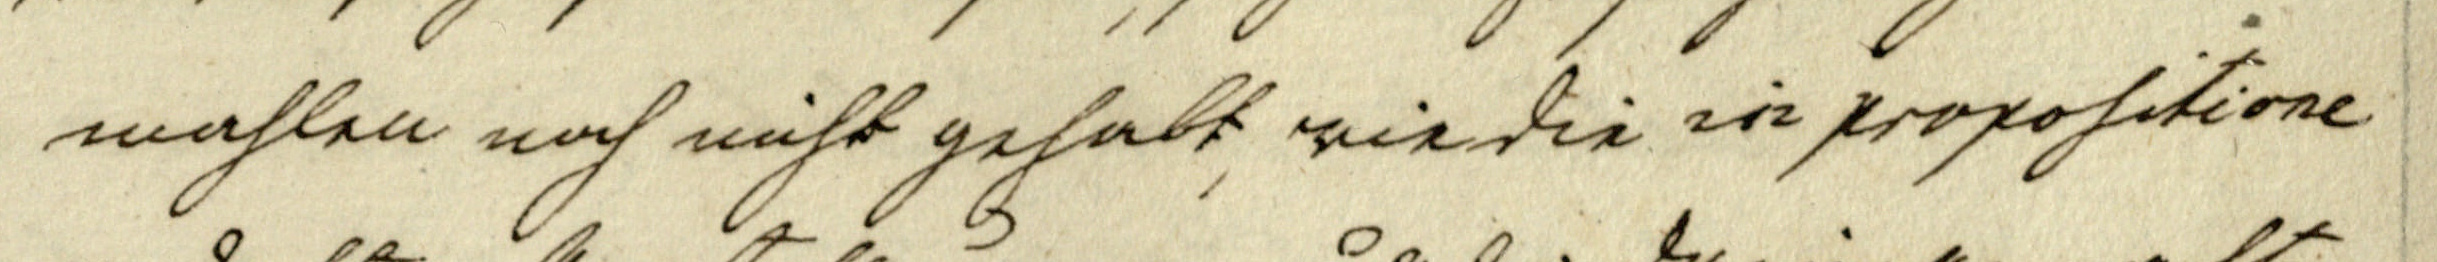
mahlen noch nicht gehabt, wie die in propositione
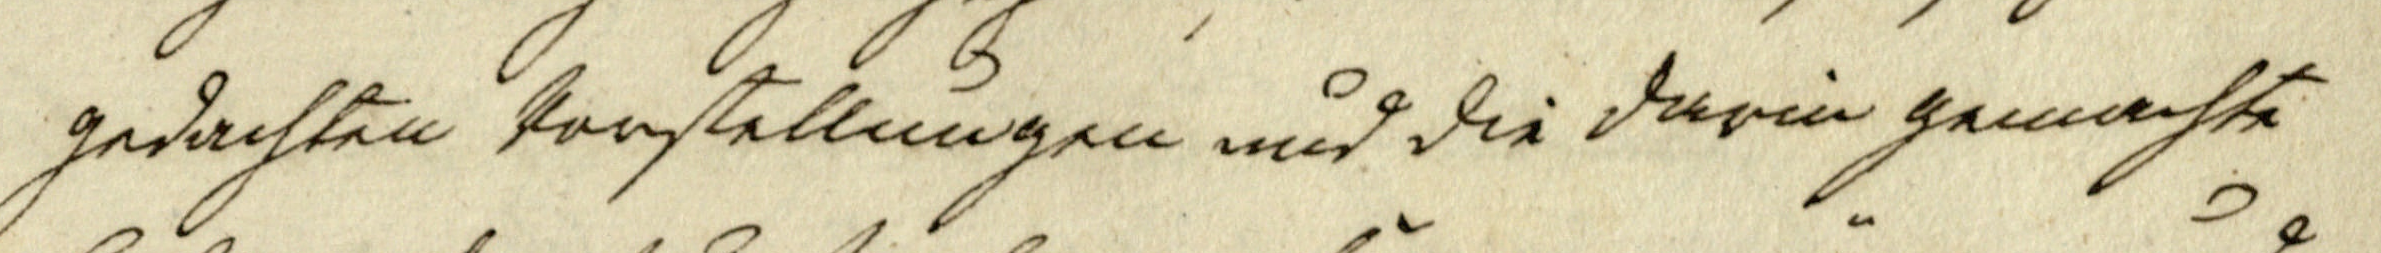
gedachten Vorstellungen und die darin gemachte
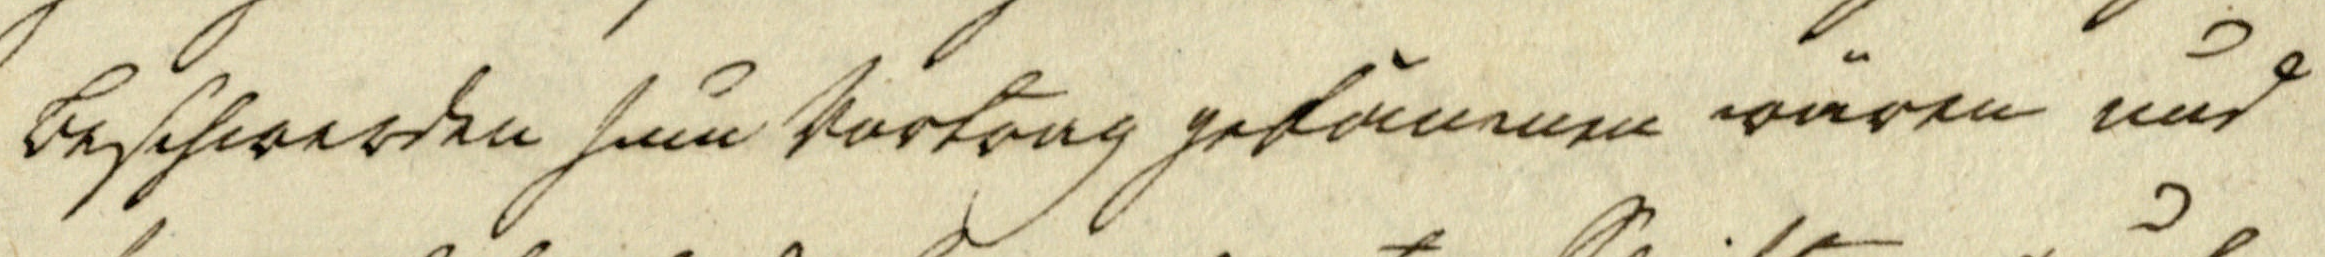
Beschwerden zum Vortrag gekommen wären und
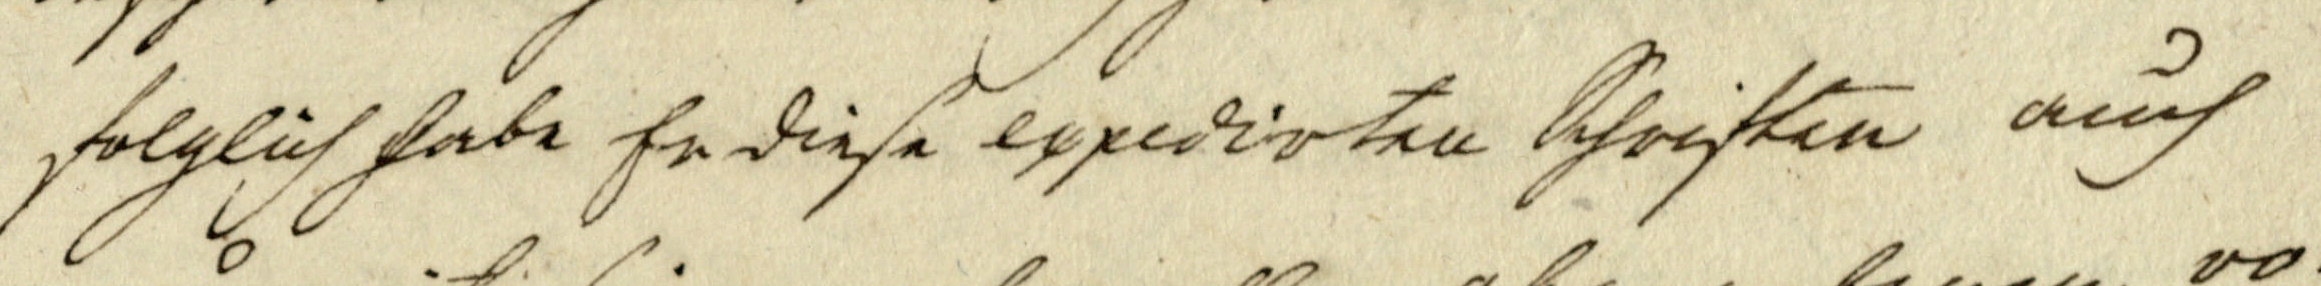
folglich habe Er diese expedirten Schriften auch
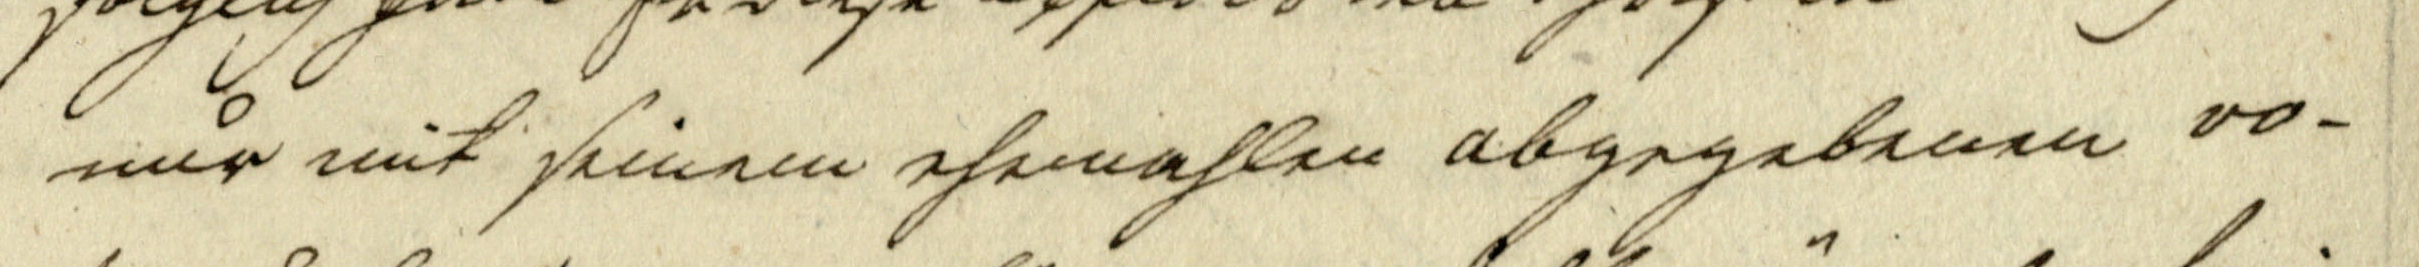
nur mit seinem ehemahlen abgegebenen vo¬
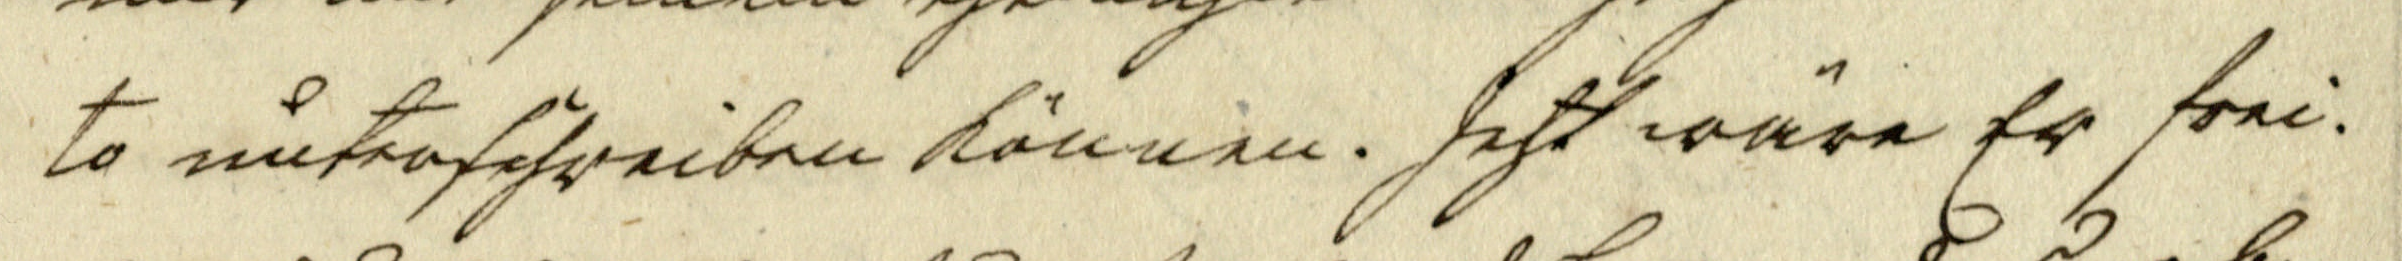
to unterschreiben können. Jetzt wäre Er frei¬
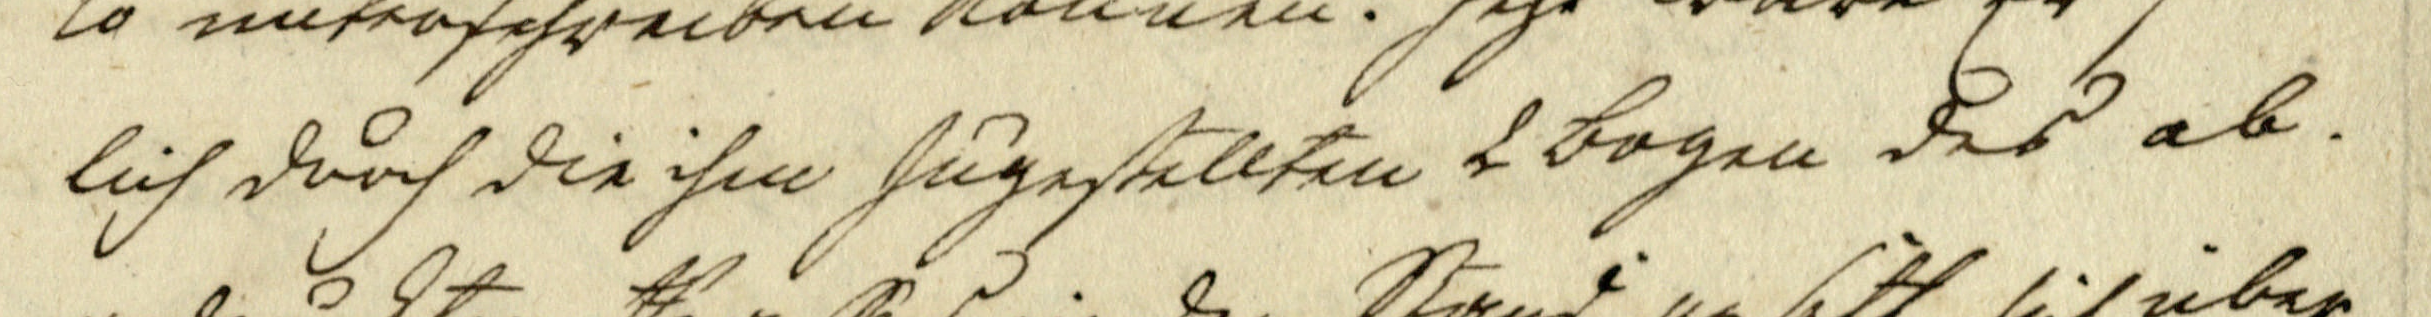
lich durch die ihm zugestellten 2 Bogen des ab¬
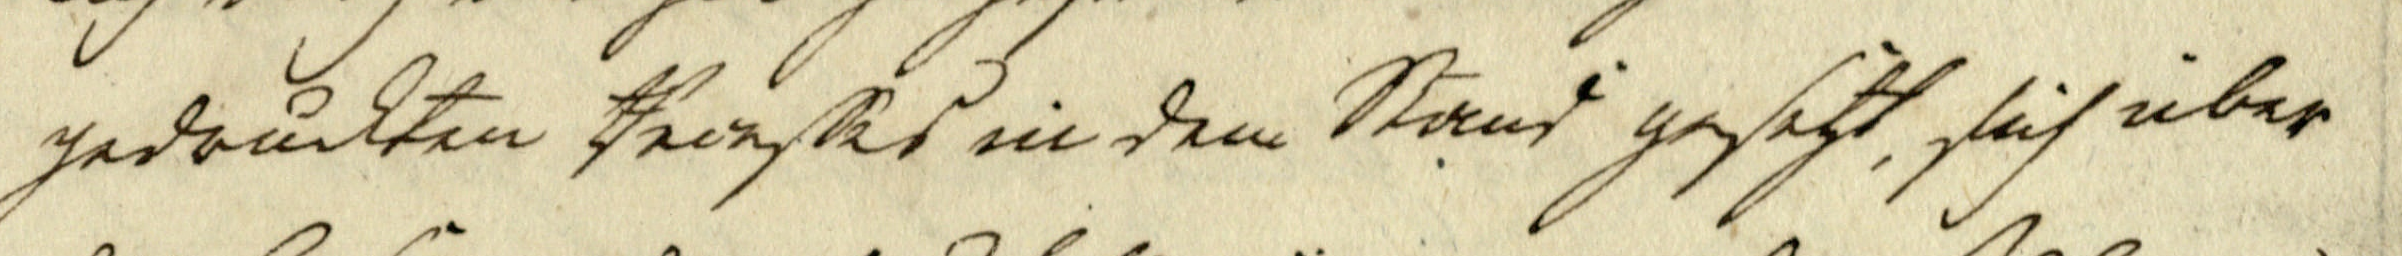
gedruckten Recesses in den Stand gesetzt, sich über
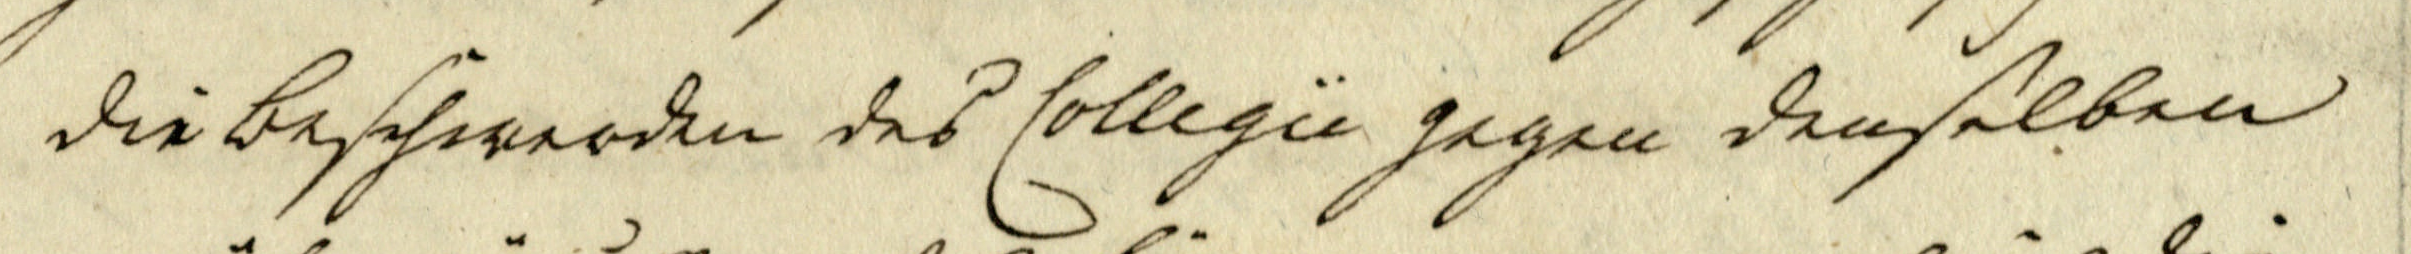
die Beschwerden des Collegii gegen denselben
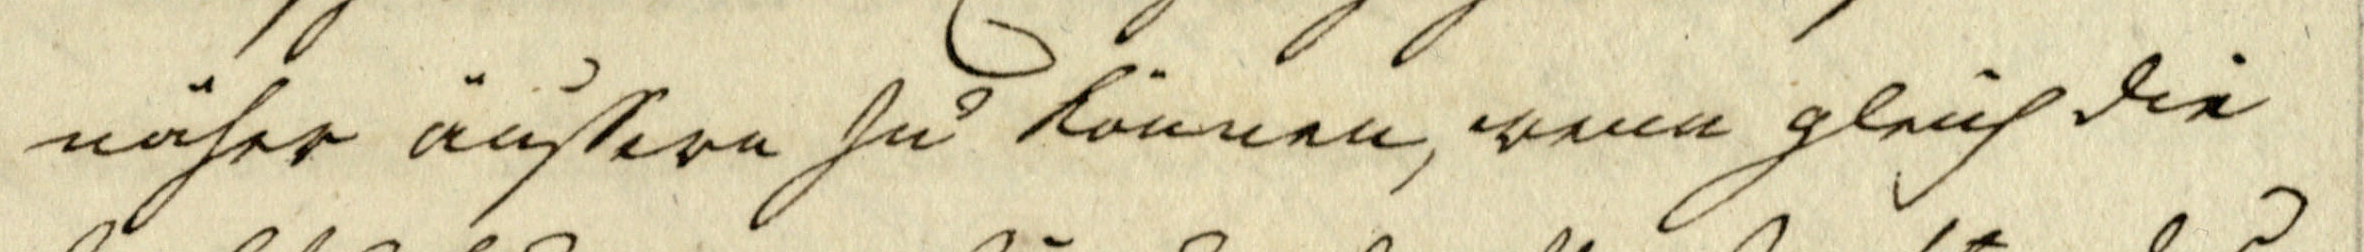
näher äussern zu können, wenn gleich die
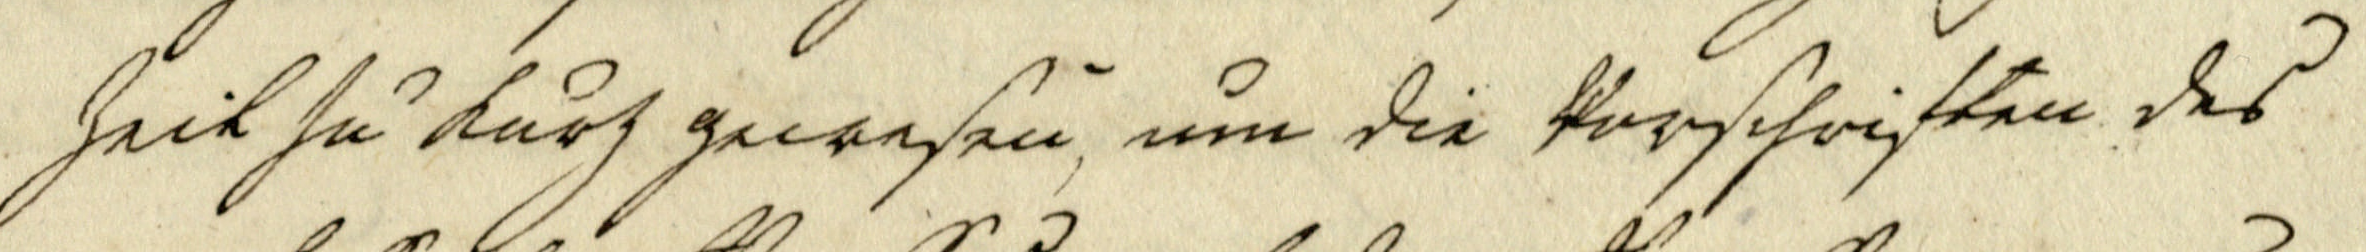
Zeit zu kurz gewesen, um die Vorschriften des
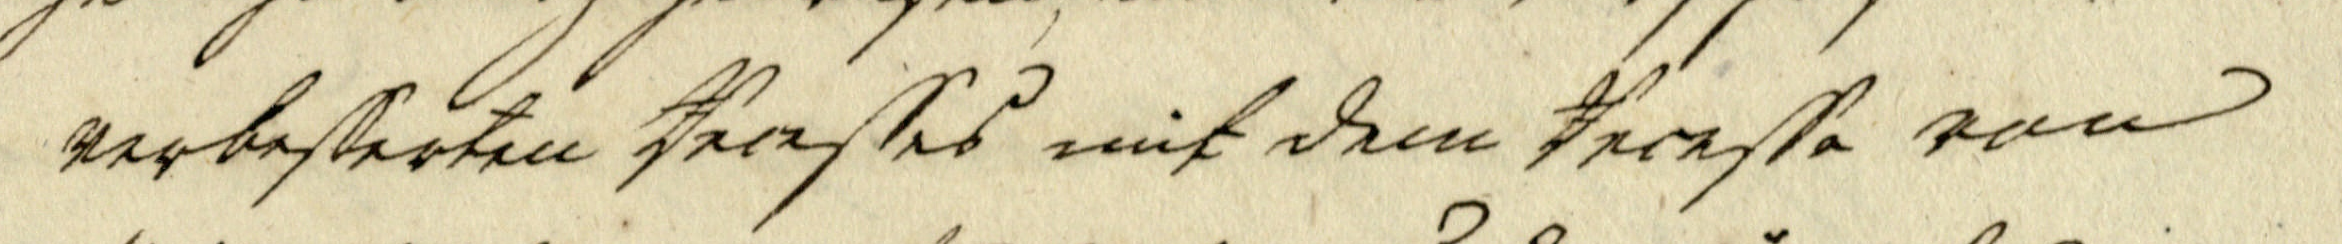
verbesserten Recesses mit dem Recesse von
